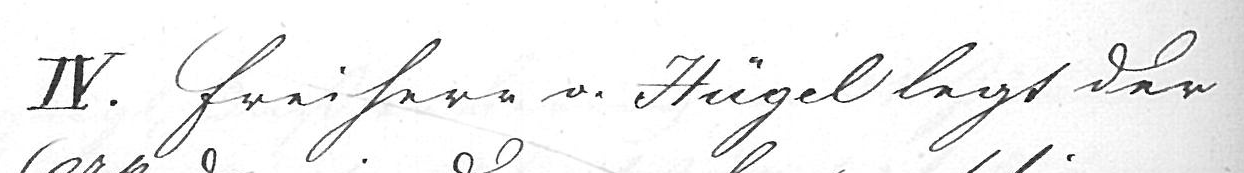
IV. Freiherr v. Hügel legt der
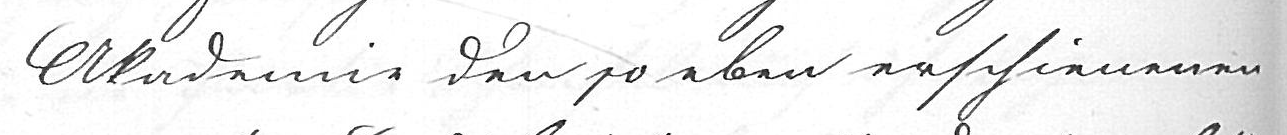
Akademie den soeben erschienenen
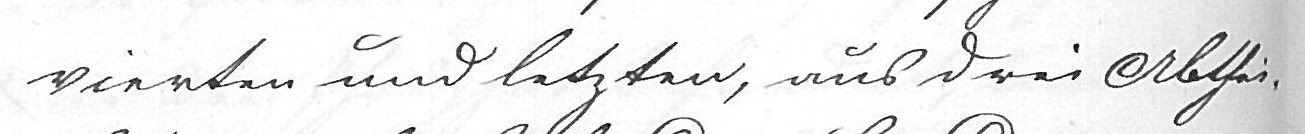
vierten und letzten, aus drei Abthei-
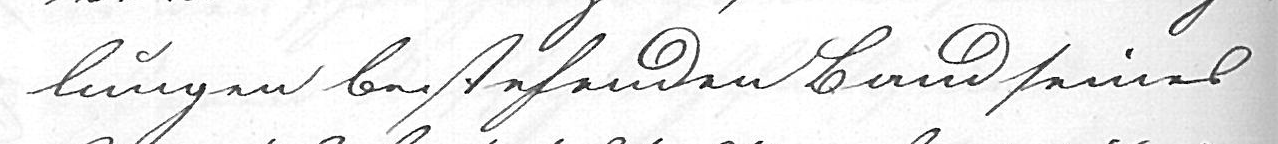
lungen bestehenden Band seines
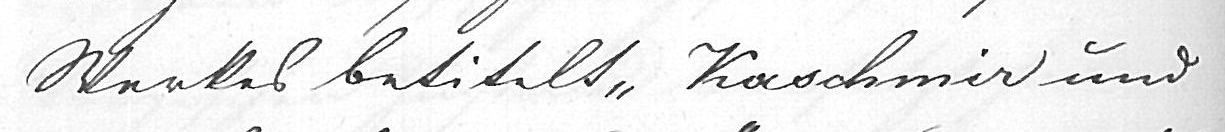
Werkes betitelt "Kaschmir und
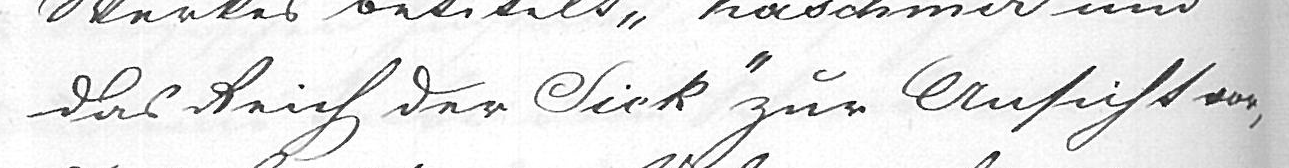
das Reich der Sick" zur Ansicht vor,
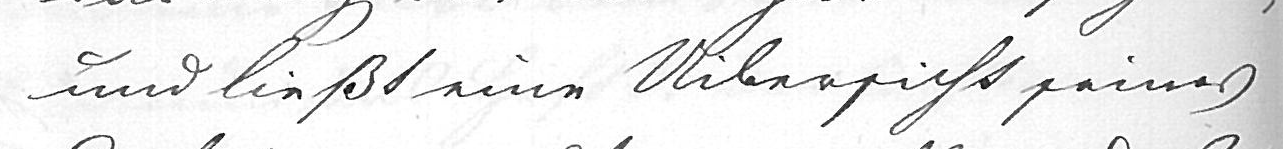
und ließt eine Uibersicht seines
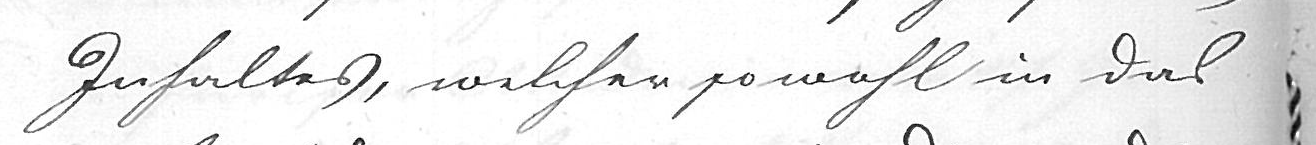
Inhaltes, welcher sowohl in das
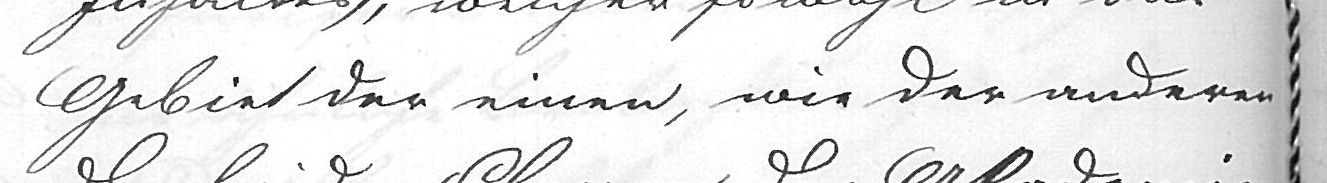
Gebiet der einen, wie der anderen
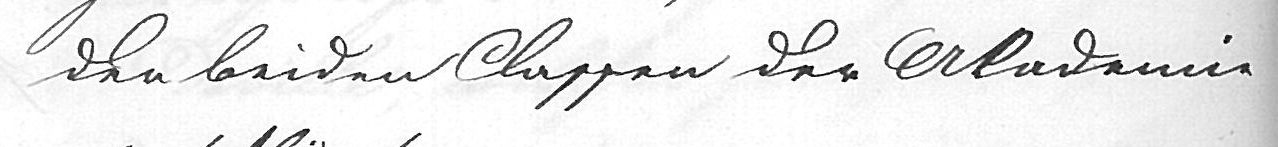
der beiden Classsen der Akademie
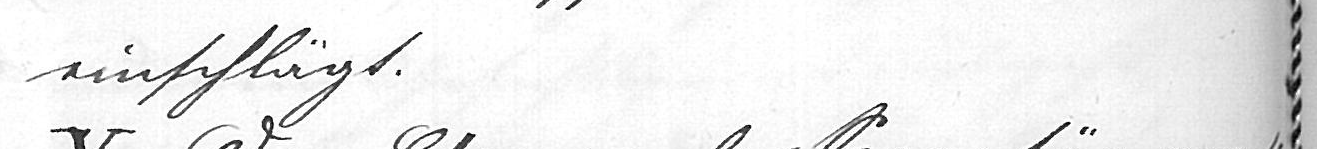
einschlägt.
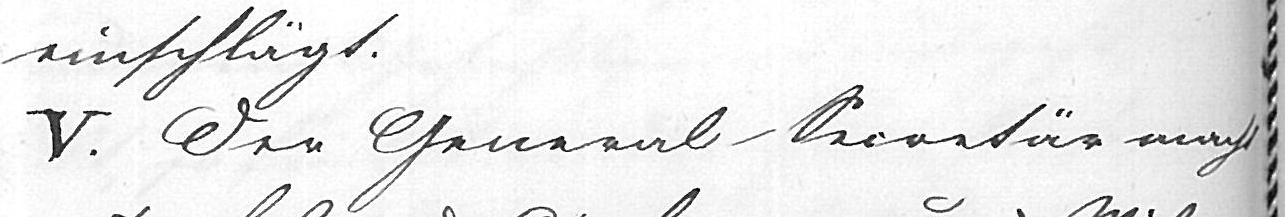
V. Der General-Secretär macht
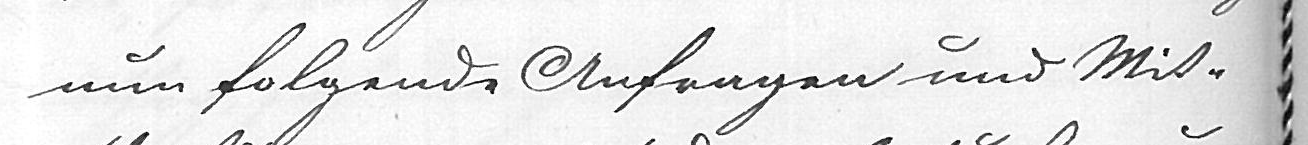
nun folgende Anfragen und Mit-
